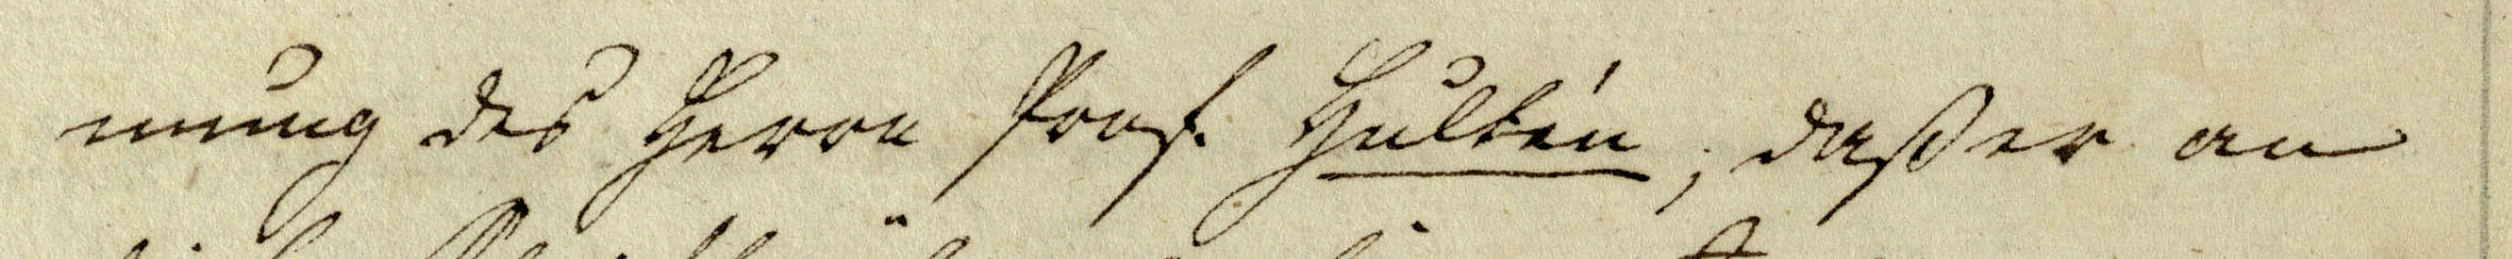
mung des Herrn Prof. Hultén, daß er an
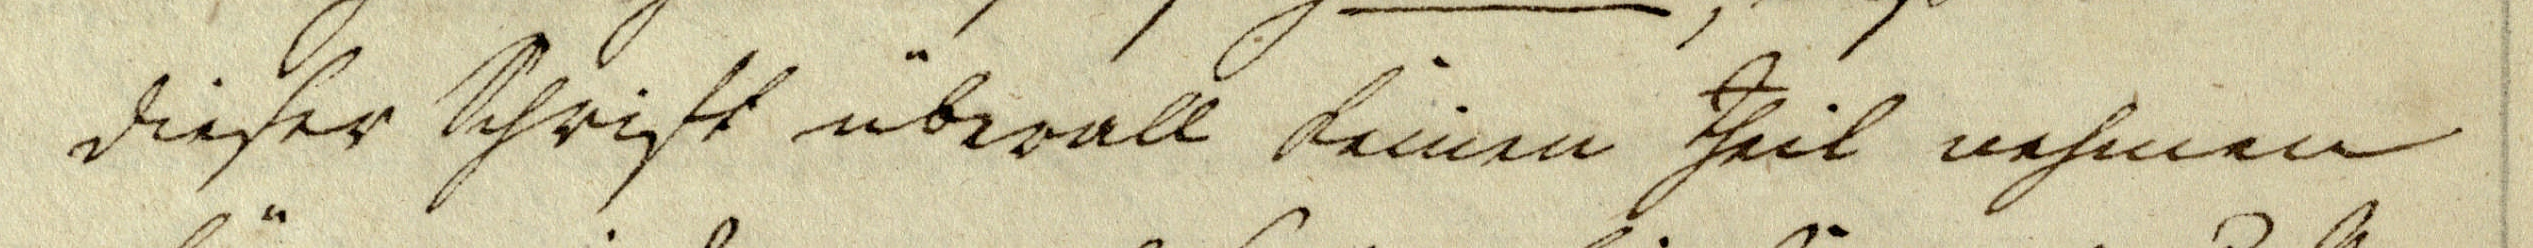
dieser Schrift überall keinen Theil nehmen
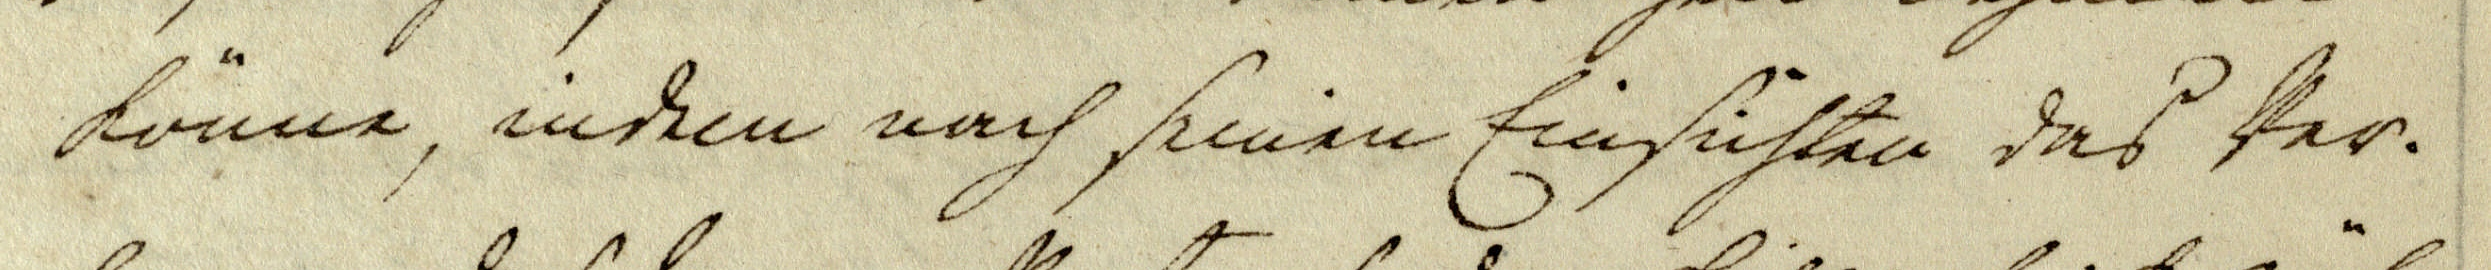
könne, indem nach seinen Einsichten das Ver¬
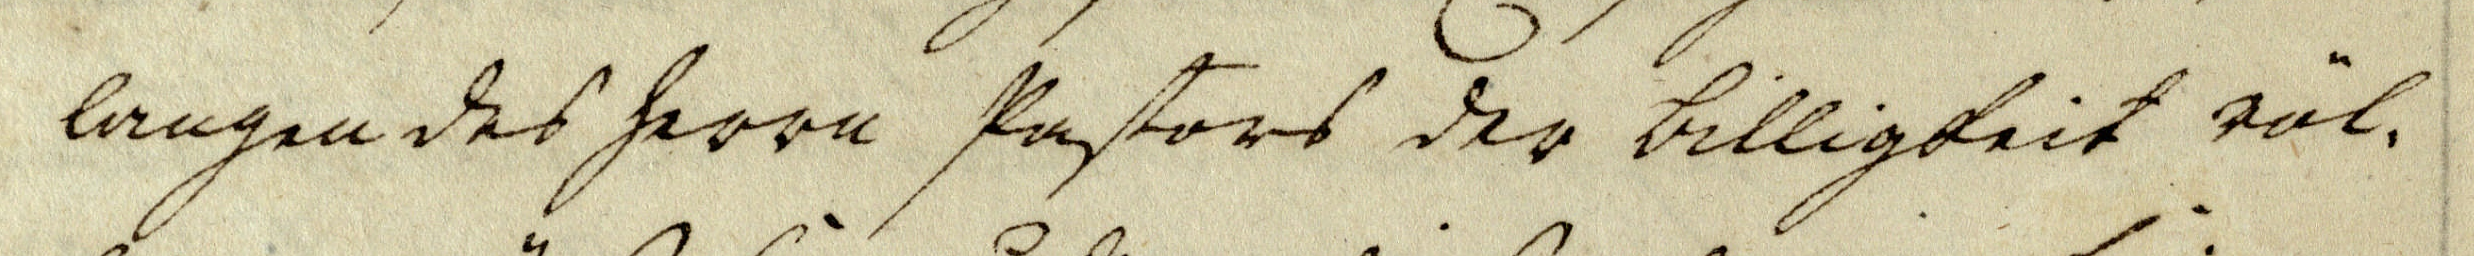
langen des Herrn Pastors der Billigkeit völ¬
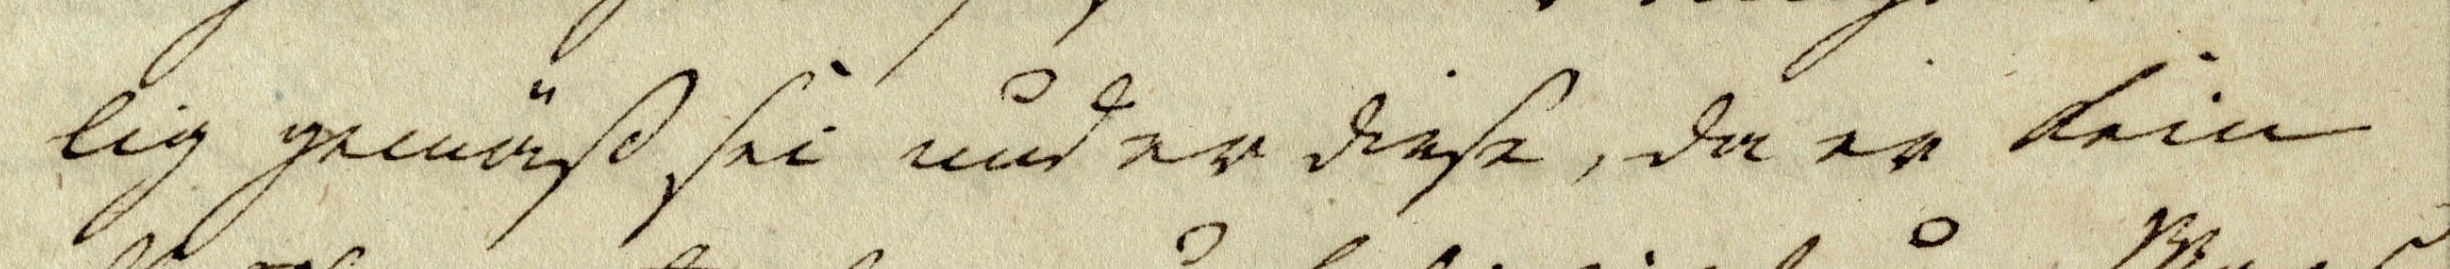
lig gemäß sei und er diese, da er kein
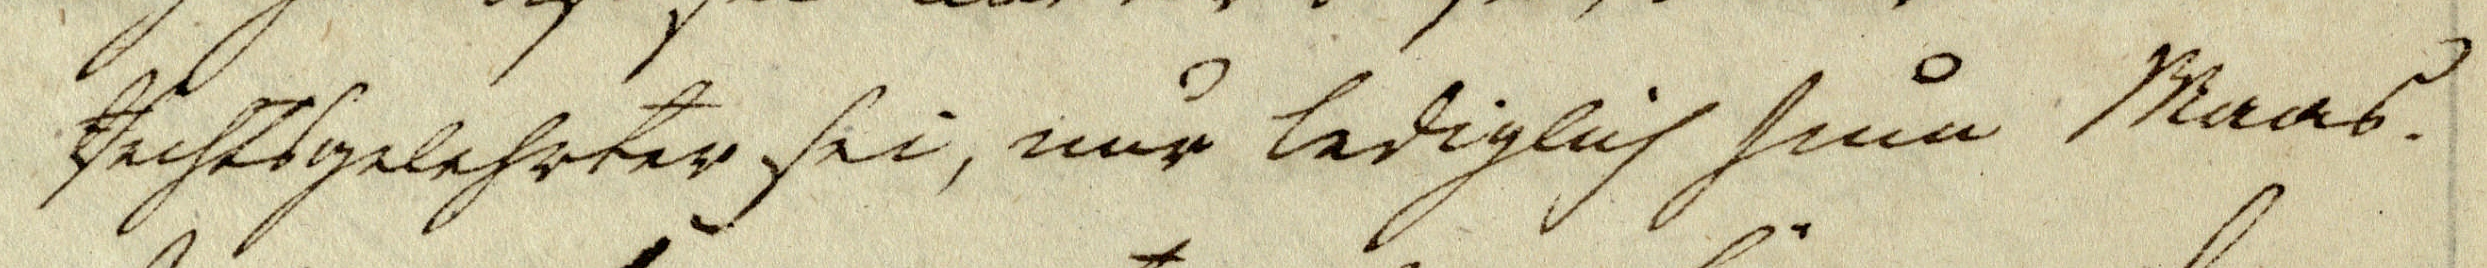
Rechtsgelehrter sei, nur lediglich zum Maas¬
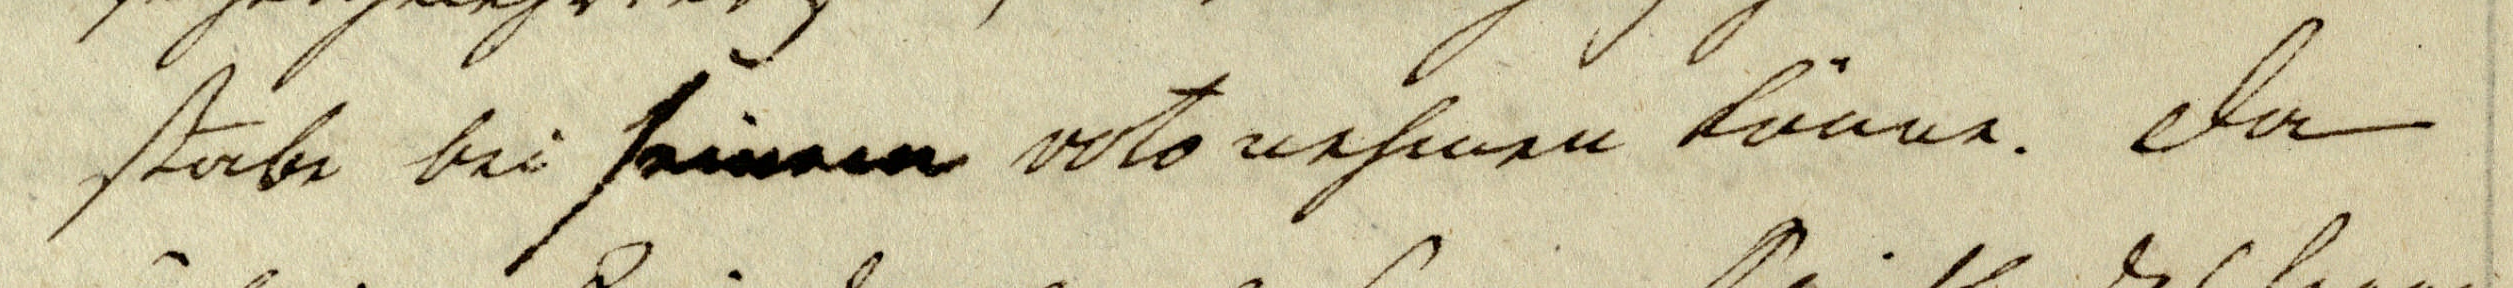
stabe bei seinem voto nehmen könne. Da
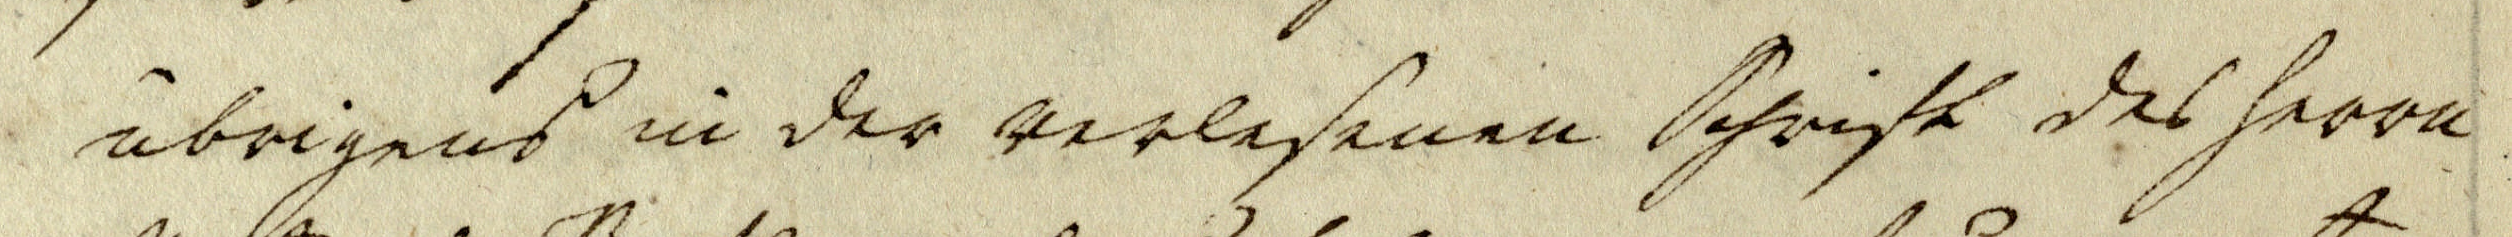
übrigens in der verlesenen Schrift des Herrn
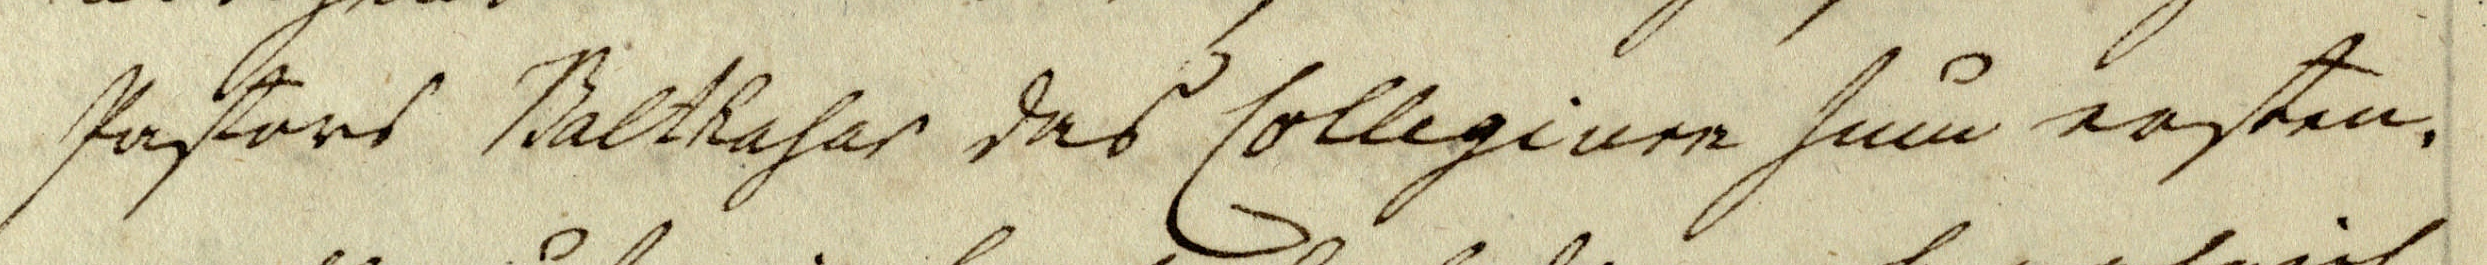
Pastors Balthasar das Collegium zum ersten¬
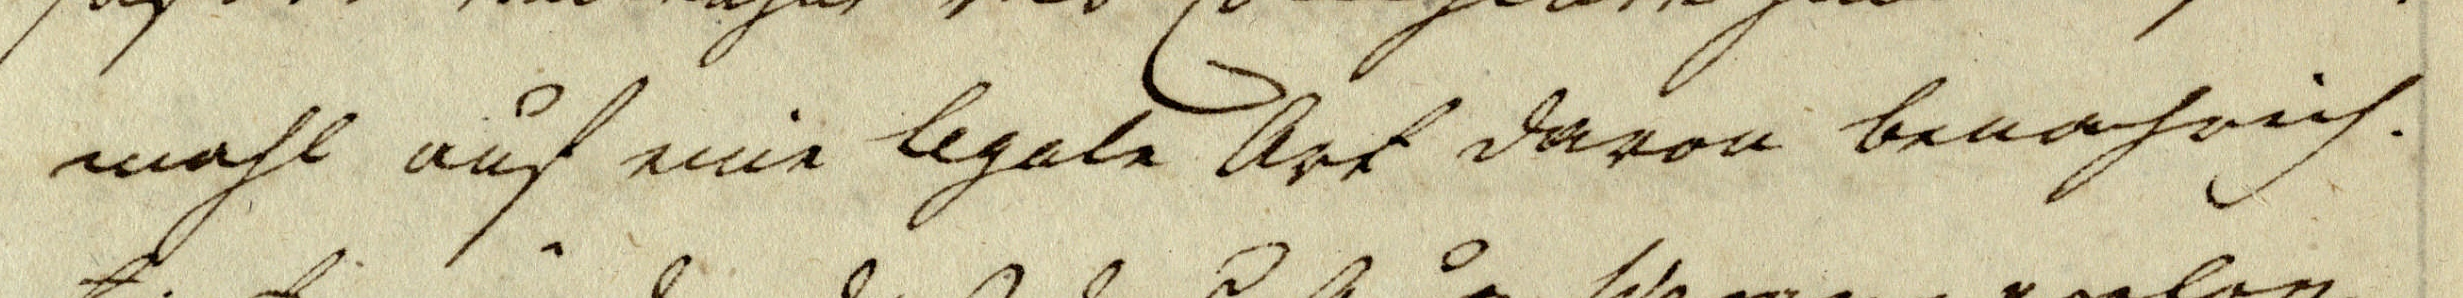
mahl auf eine legale Art davon benachrich¬
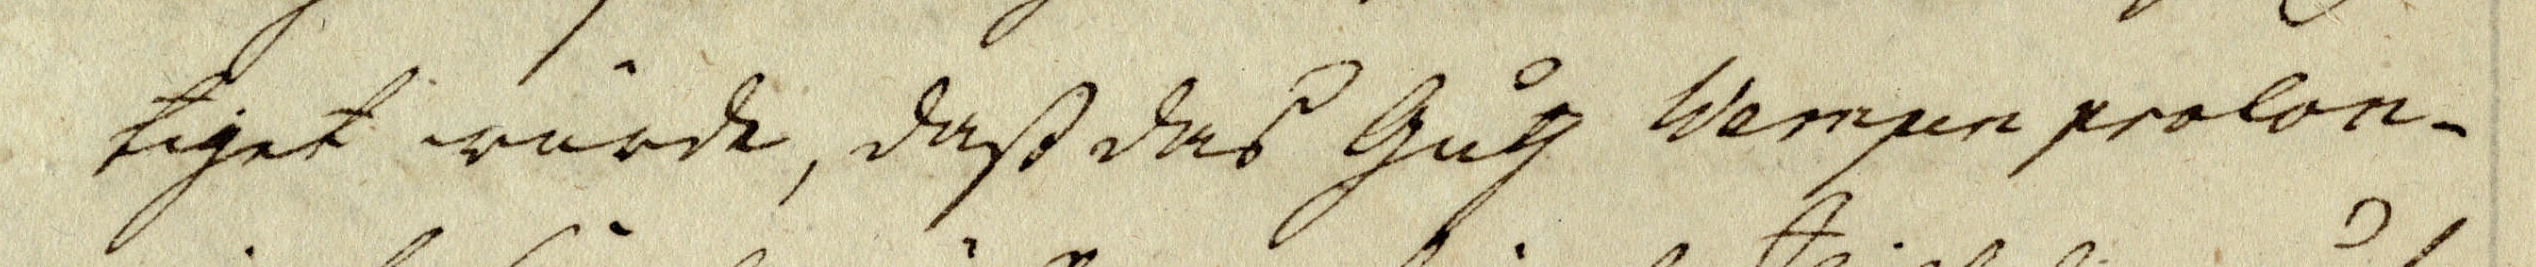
tiget würde, daß das Guth Wampen prolon¬
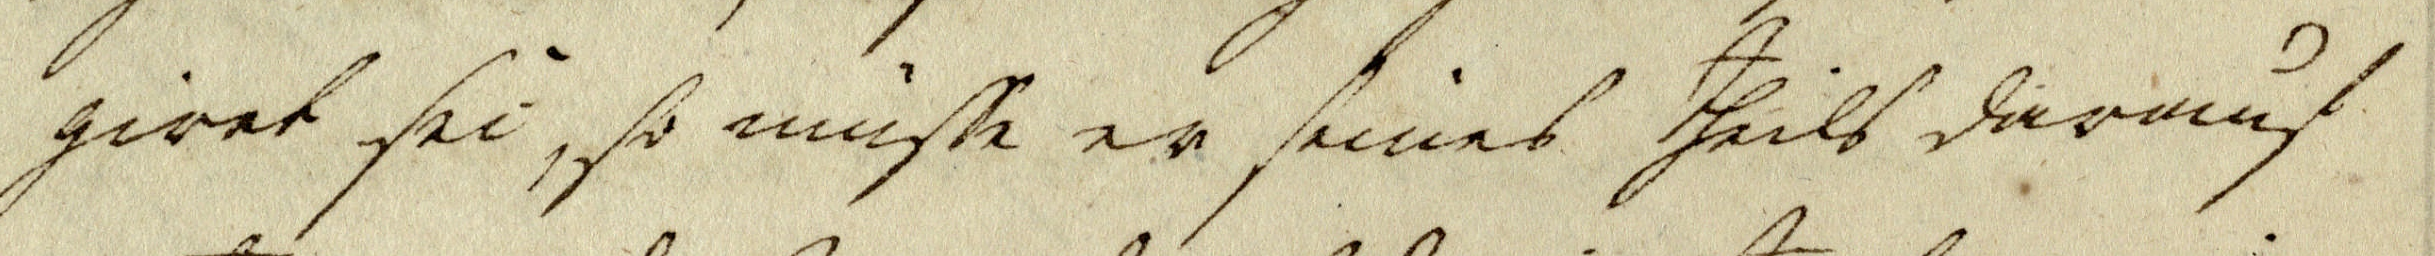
giret sei, so müsse er seines Theils darauf
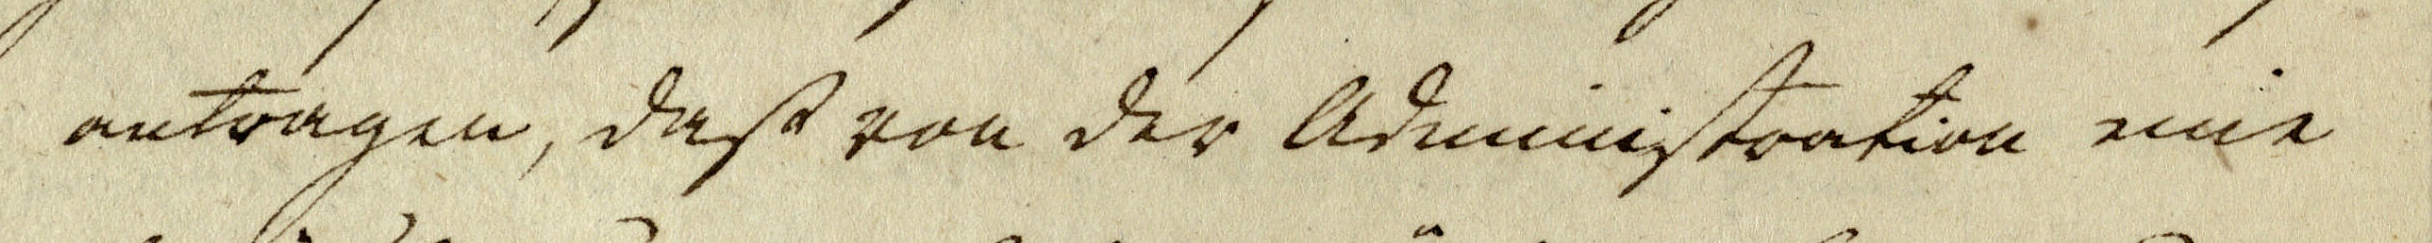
antragen, daß von der Administration eine
